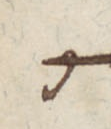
unver
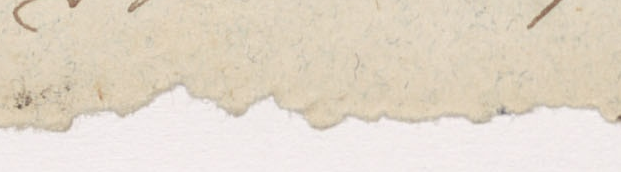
grade hierin
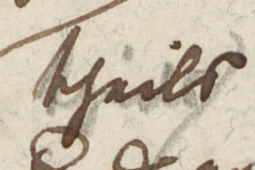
scheiden
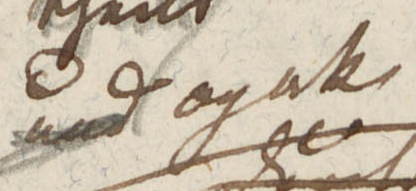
% Römischen
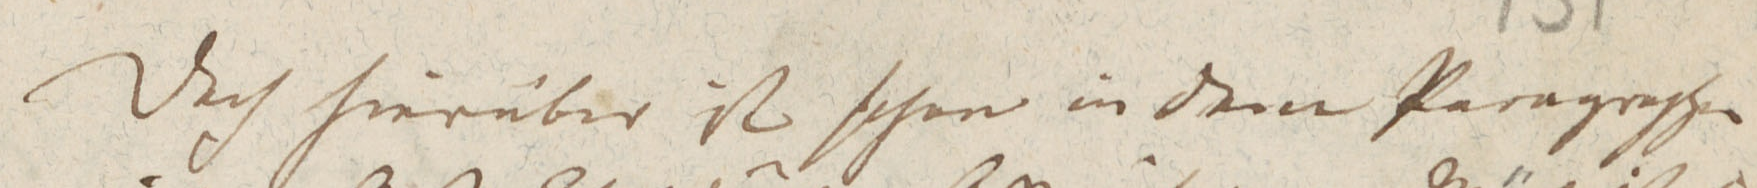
Doch hierüber ist schon in dem Paragraphen
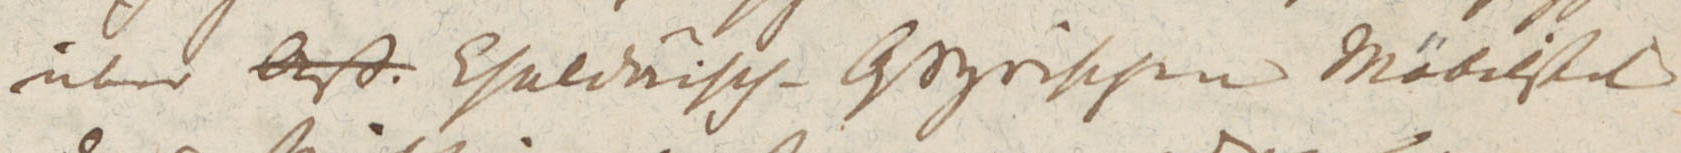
über Ass Chaldäisch-Assyrischen Moöbelstil
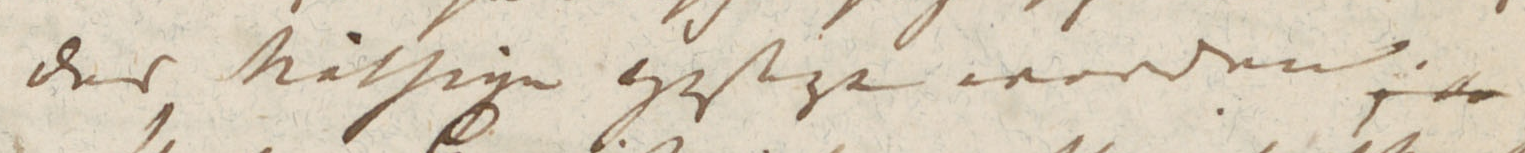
das Nöthige gesagt worden, .
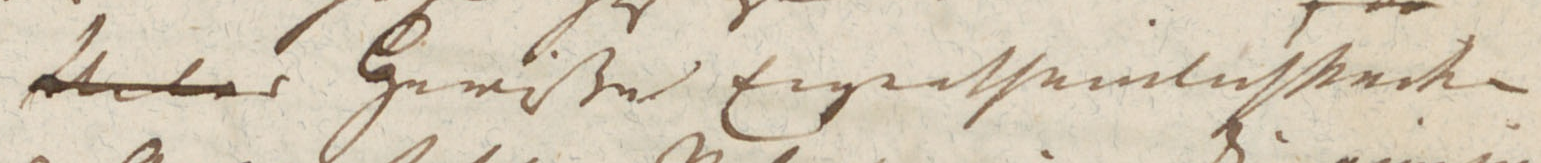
Ueber gGewisse Eigenthümlichkeiten
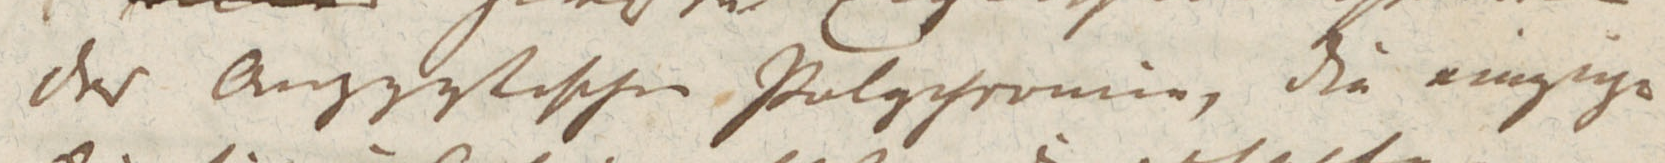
der Aegyptischen Polychromie, die einzige
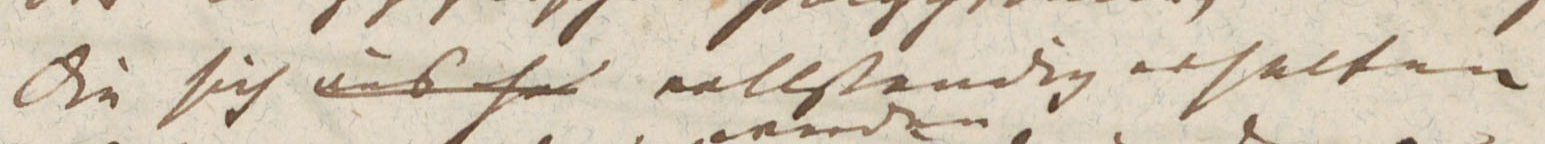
die sich aus h vollstandig erhalten
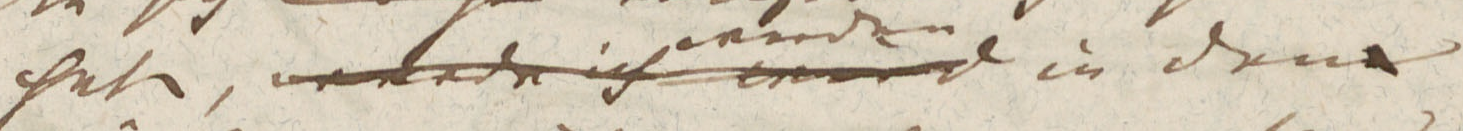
hat, werde ich wurd werden in demn
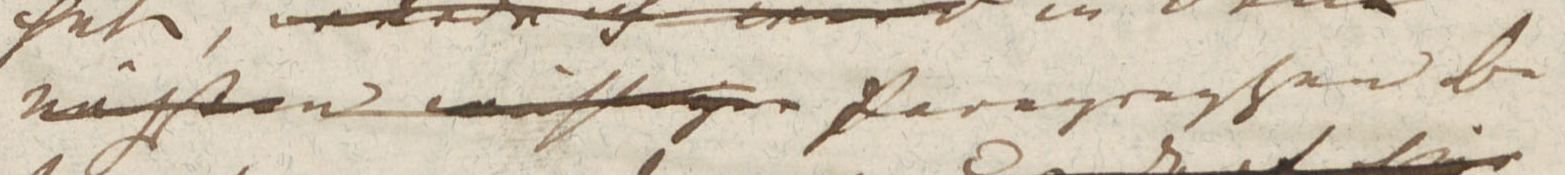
nächsten wichtigen Paragraphen be-
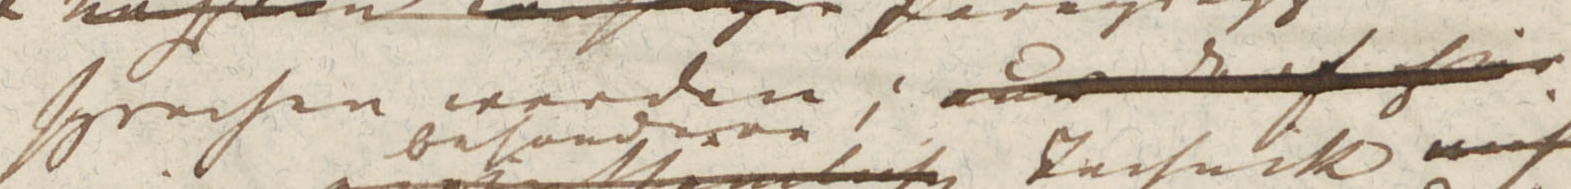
sprochen werden; aus darf hier
